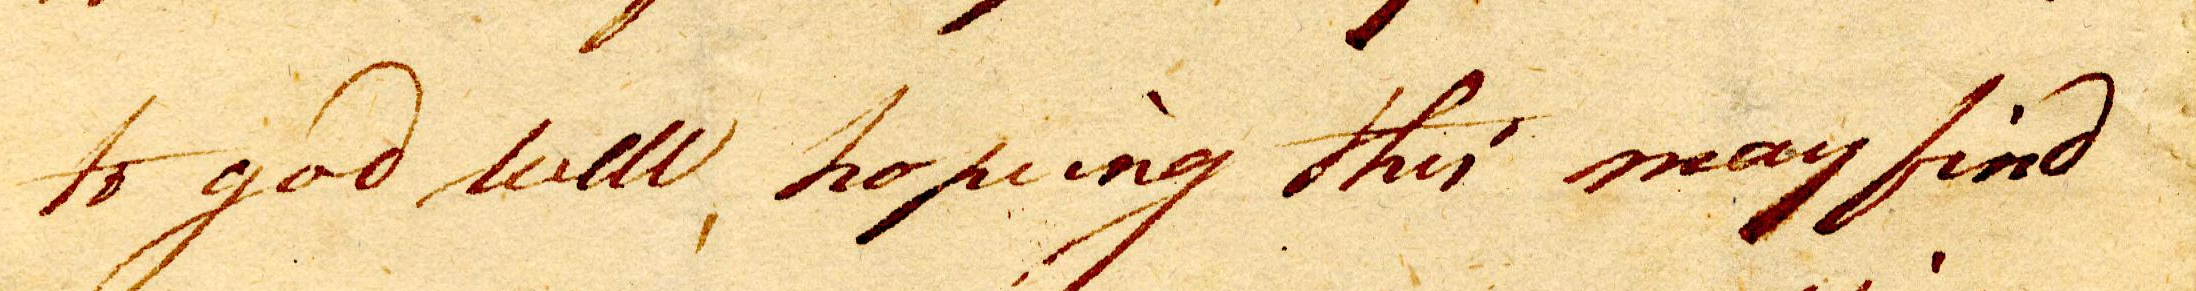to god well, hopeing this may find
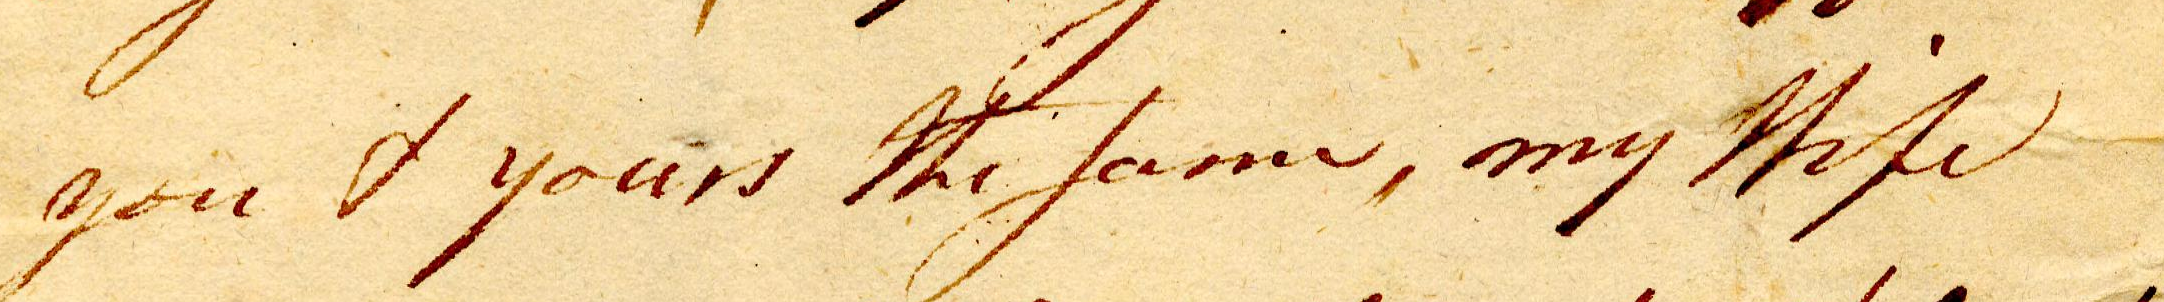you & yours the same, my Wife
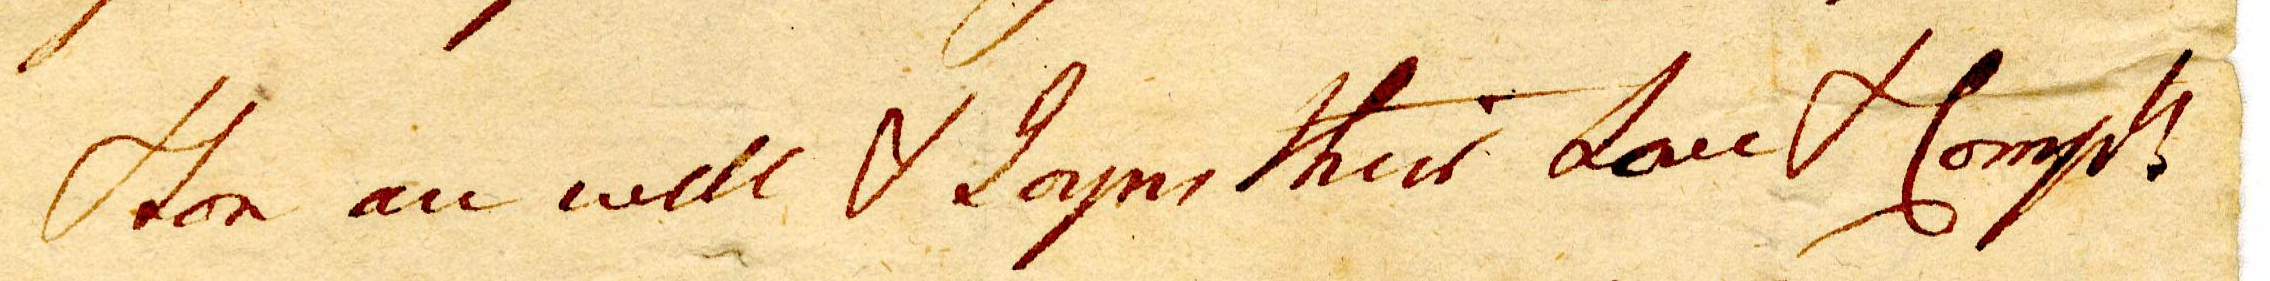& son are well & Joyns their love & Comp^ts.
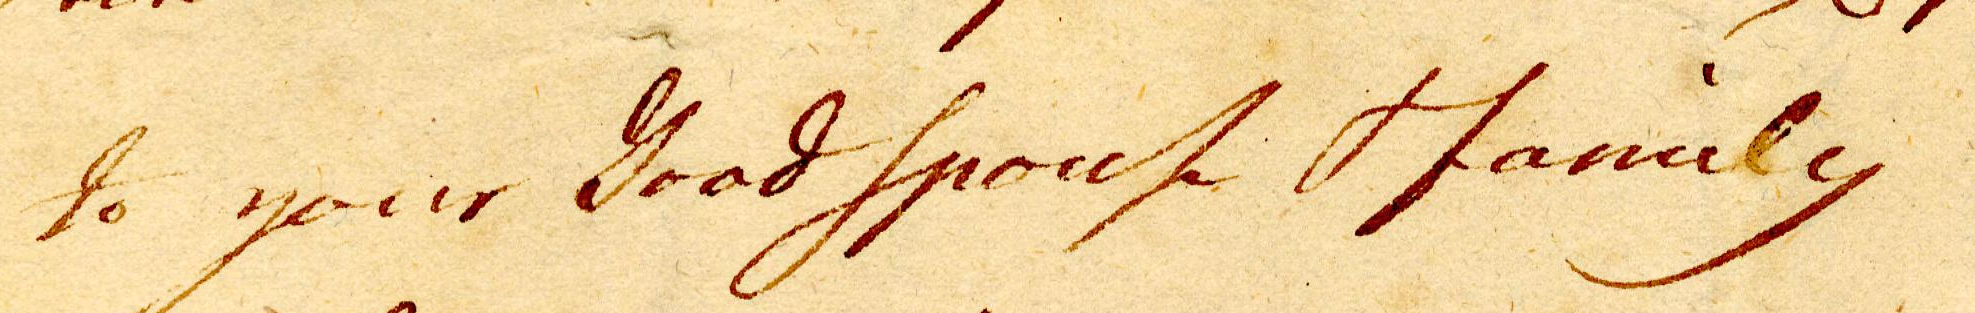to your Good spouse & family
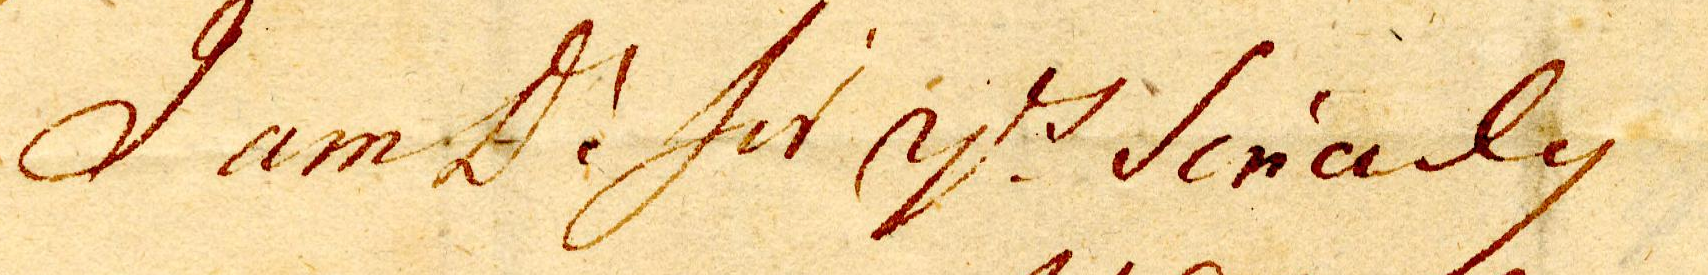I am D^r. sir y^rs. Sincerly
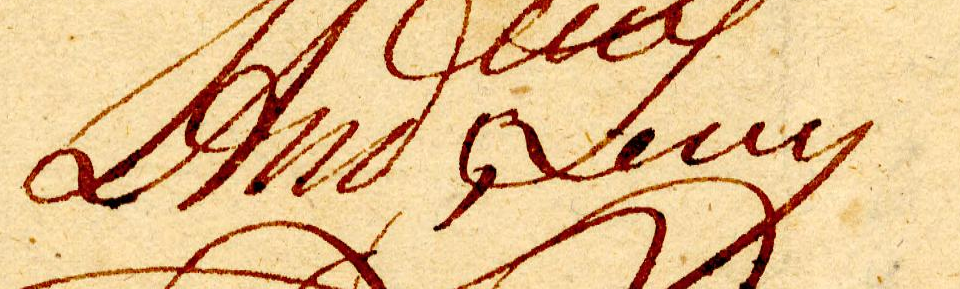And^rew Levy.
